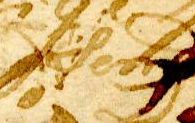send
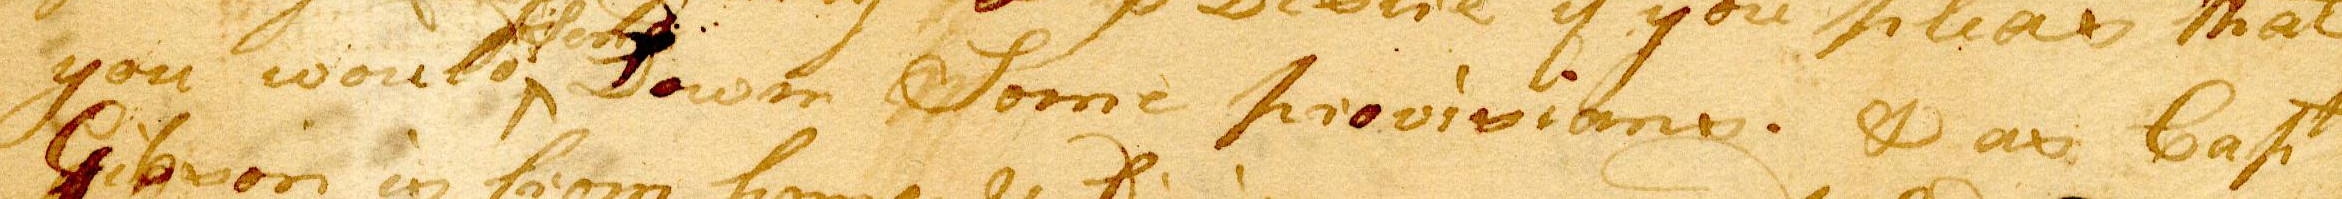you would ^ Down Some provisions. & as Cap^t
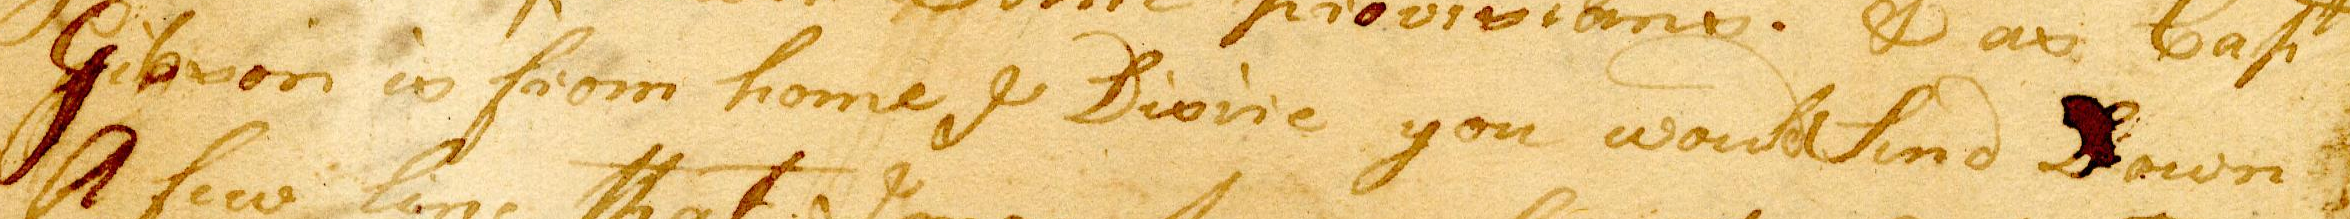Gibson is from home & Desire you would Send down
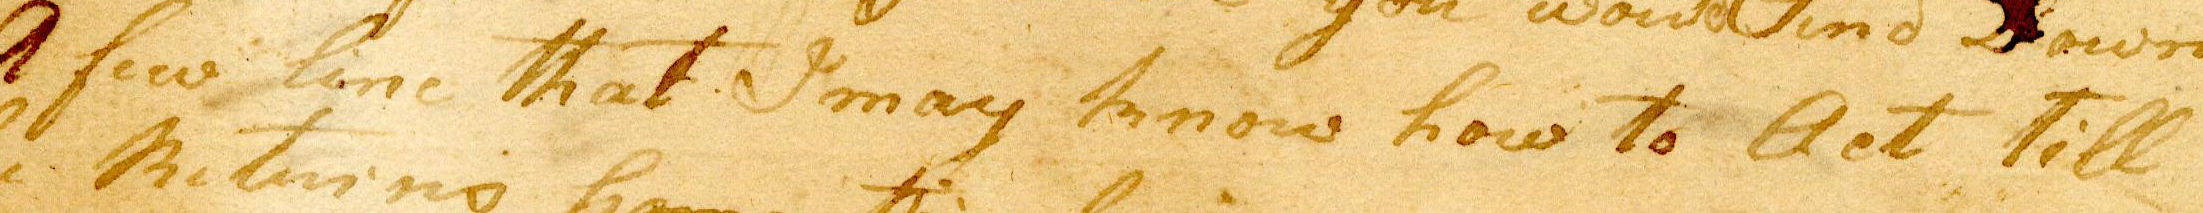a few line that I may know how to Act till
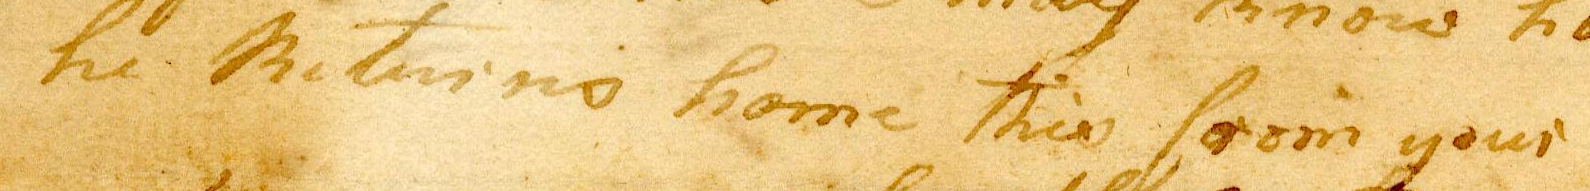he Returns home this from your
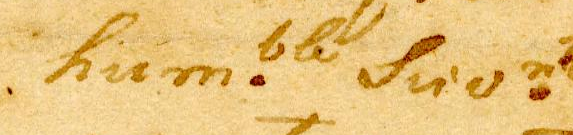hum^ble. Serv^t.
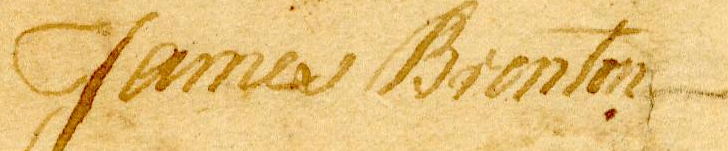James Brenton
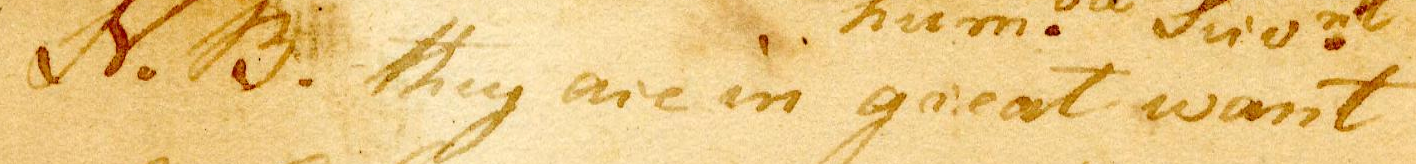N.B. they are in great want
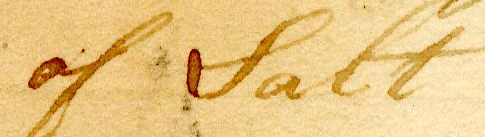of Salt
